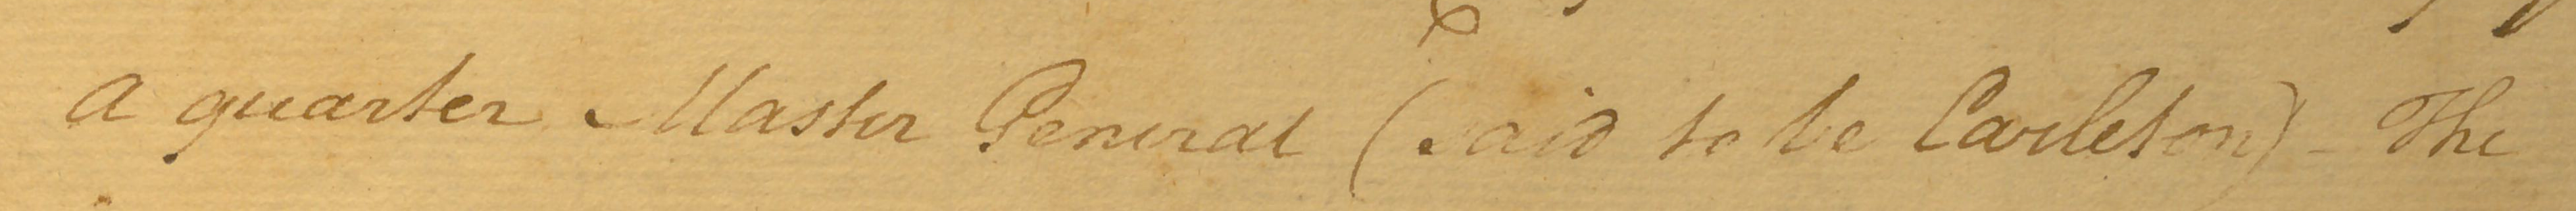a quarter Master General (said to be Carleton) The
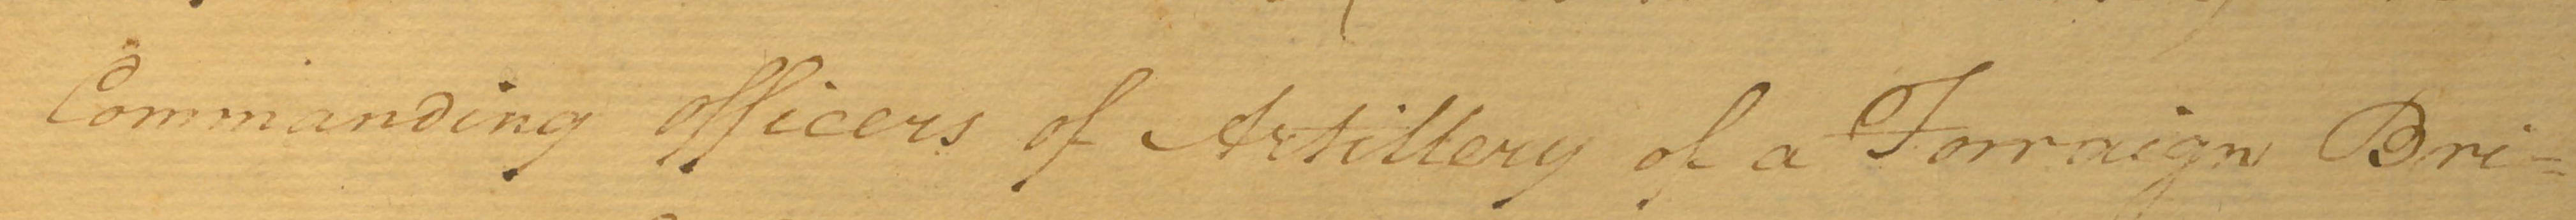Commanding officers of Artillery of a Forraign Bri-
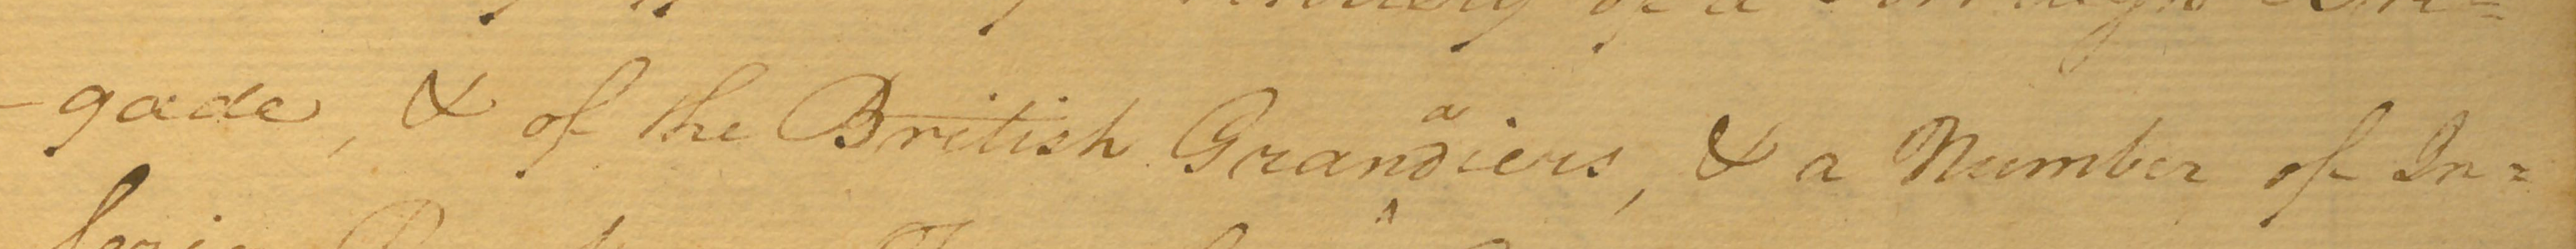gade, & of the British Gran^adiers, & a Number of In-
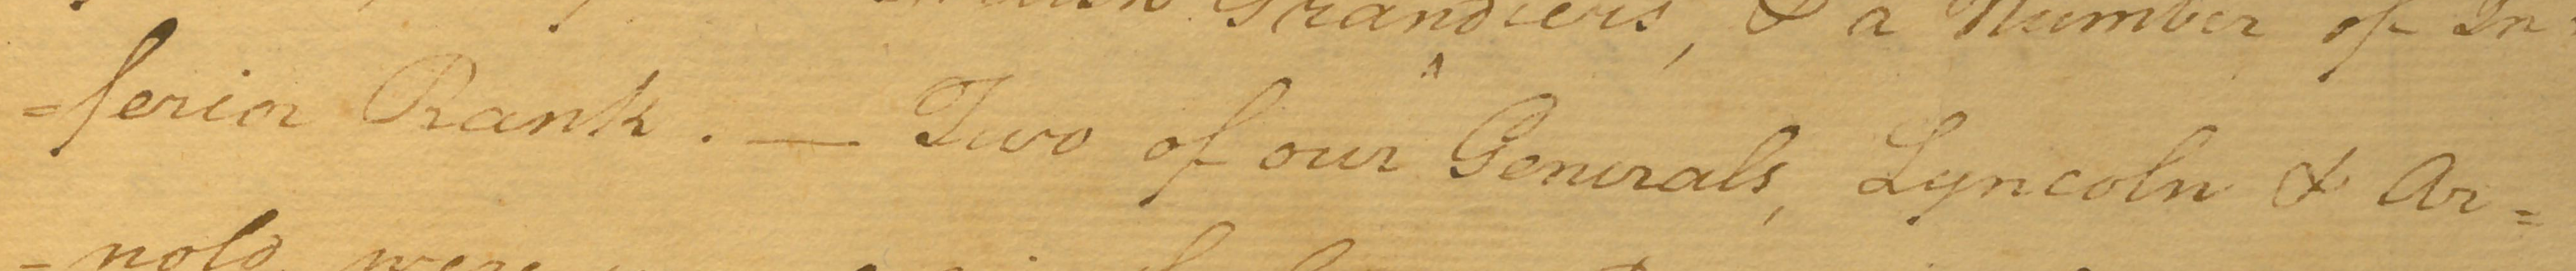-ferior Rank.- Two of our Generals Lyncoln & Ar-
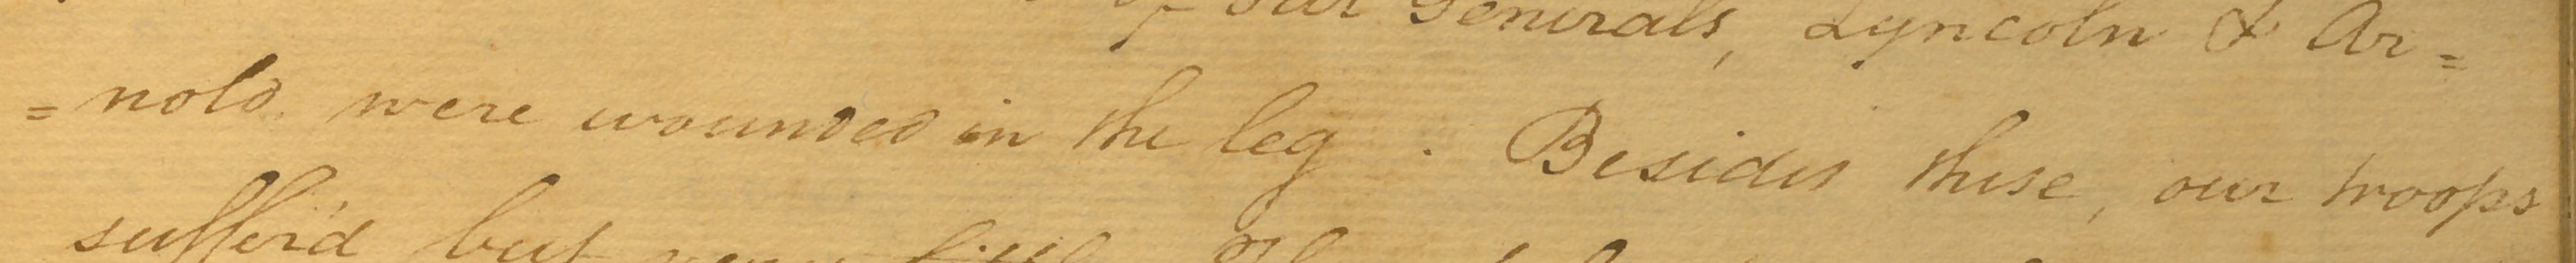-nold were wounded in the leg. Besides these, our troops
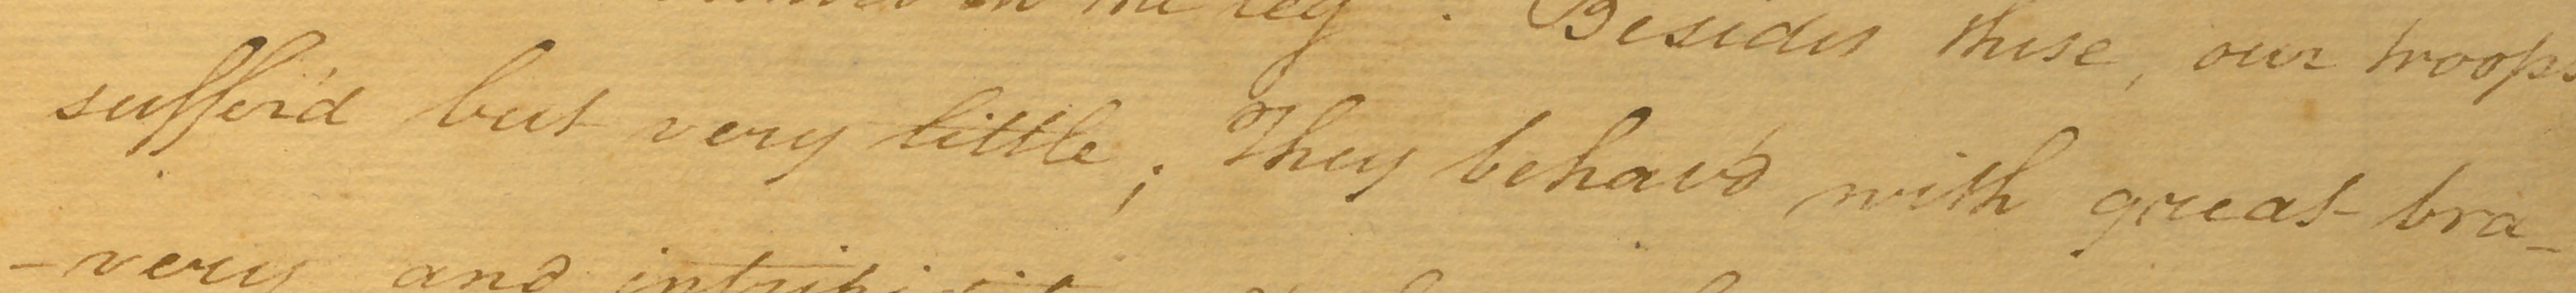suffer'd but very little; They behav'd with great bra-
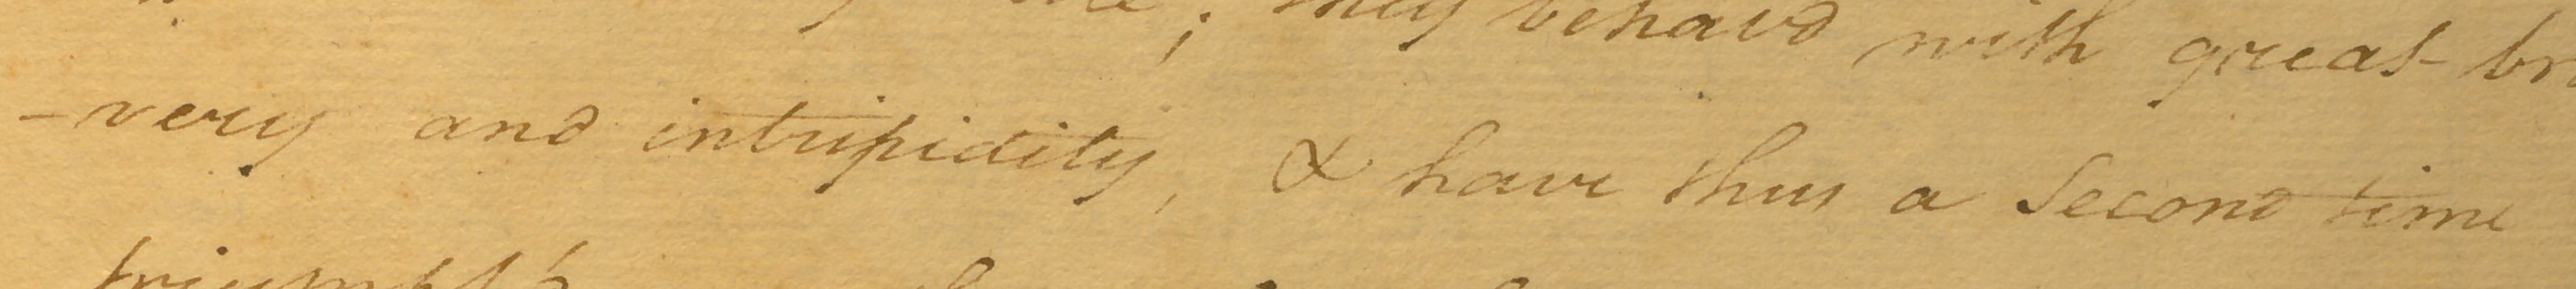-very and intripidity, & have thus a second time
